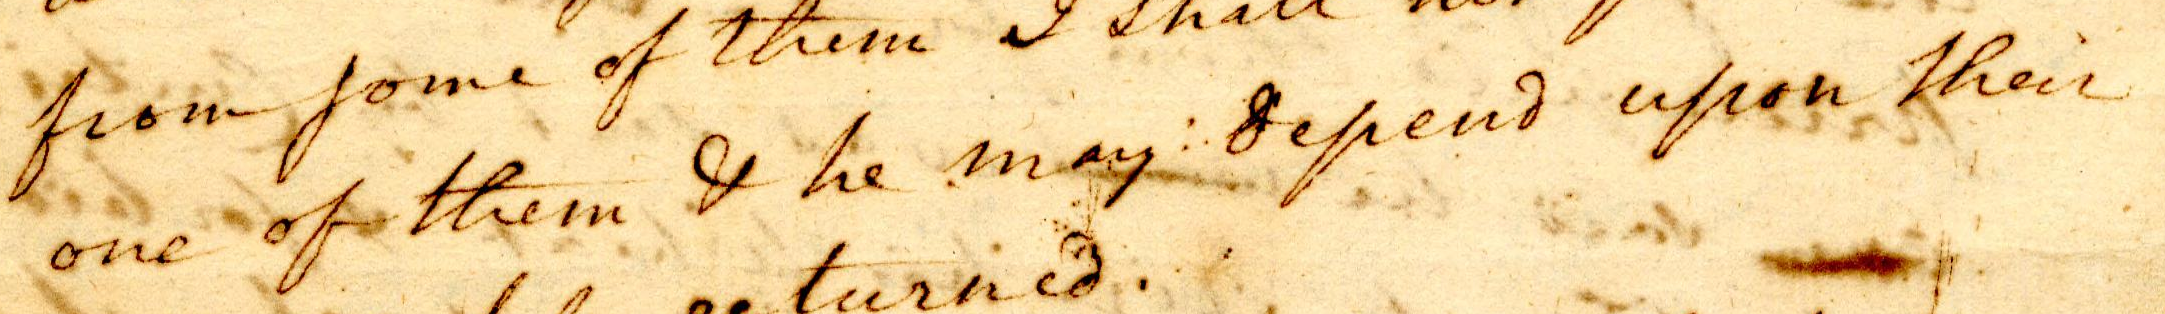one of them & he may depend upon their
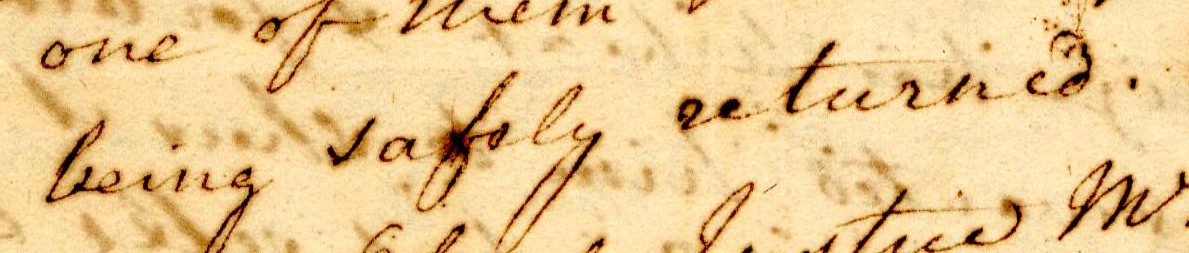being safely returned.
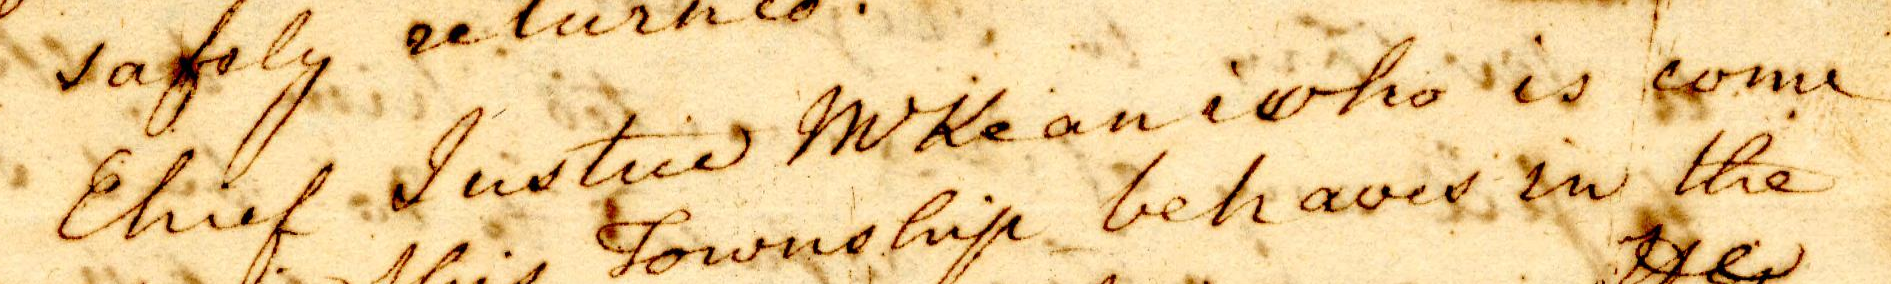Chief Justice M^cKean who is come
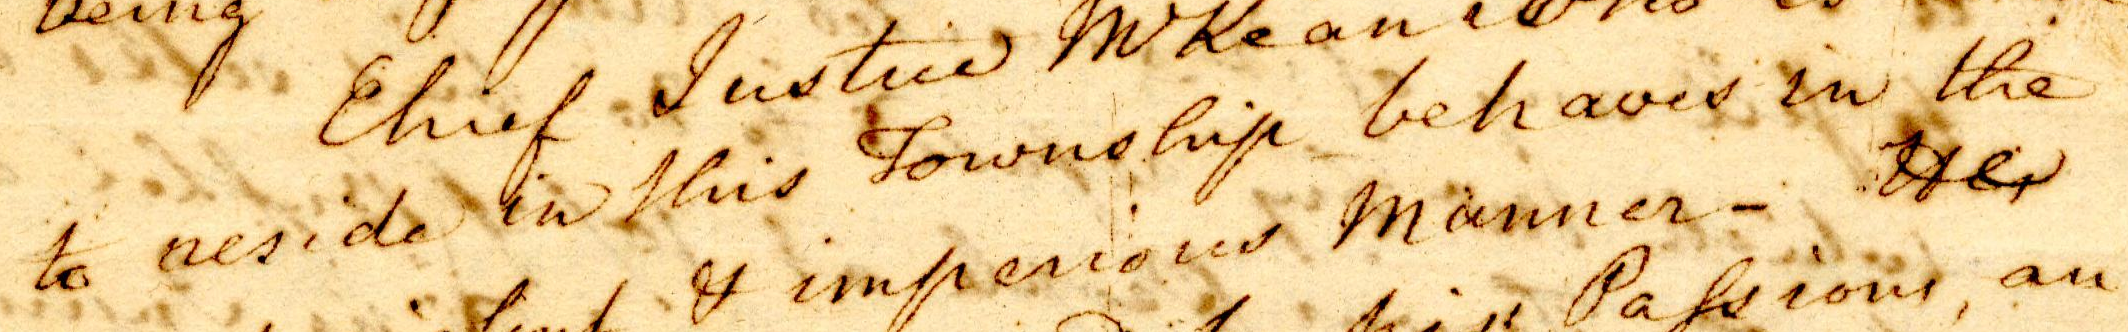to reside in this Township behaves in the
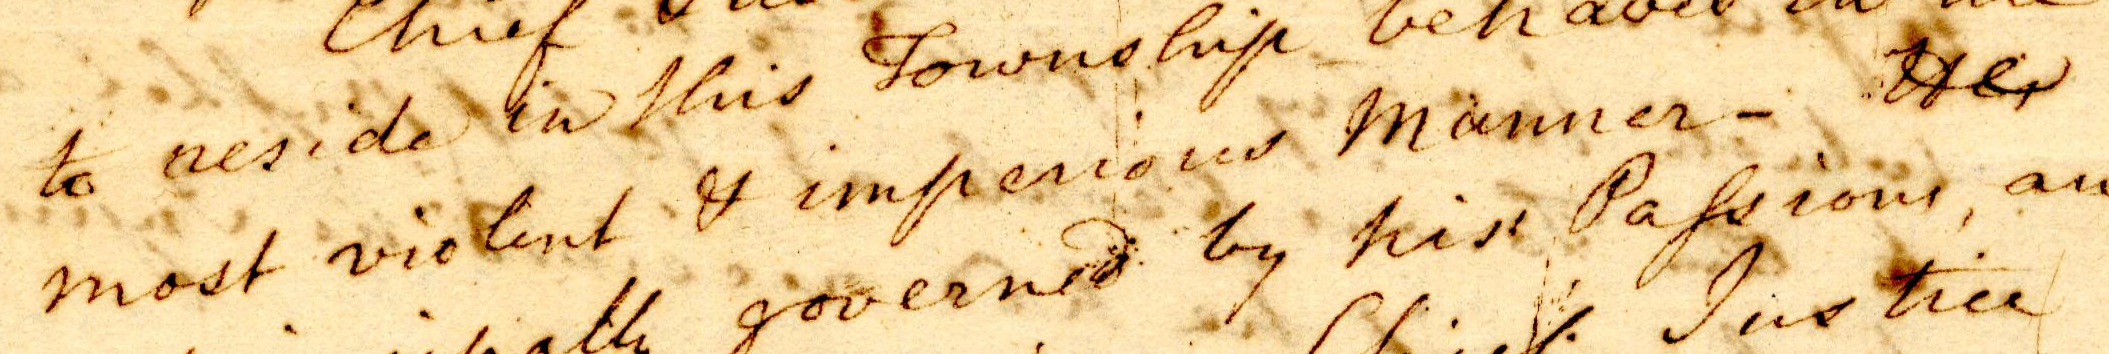most violent & imperious Manner- He
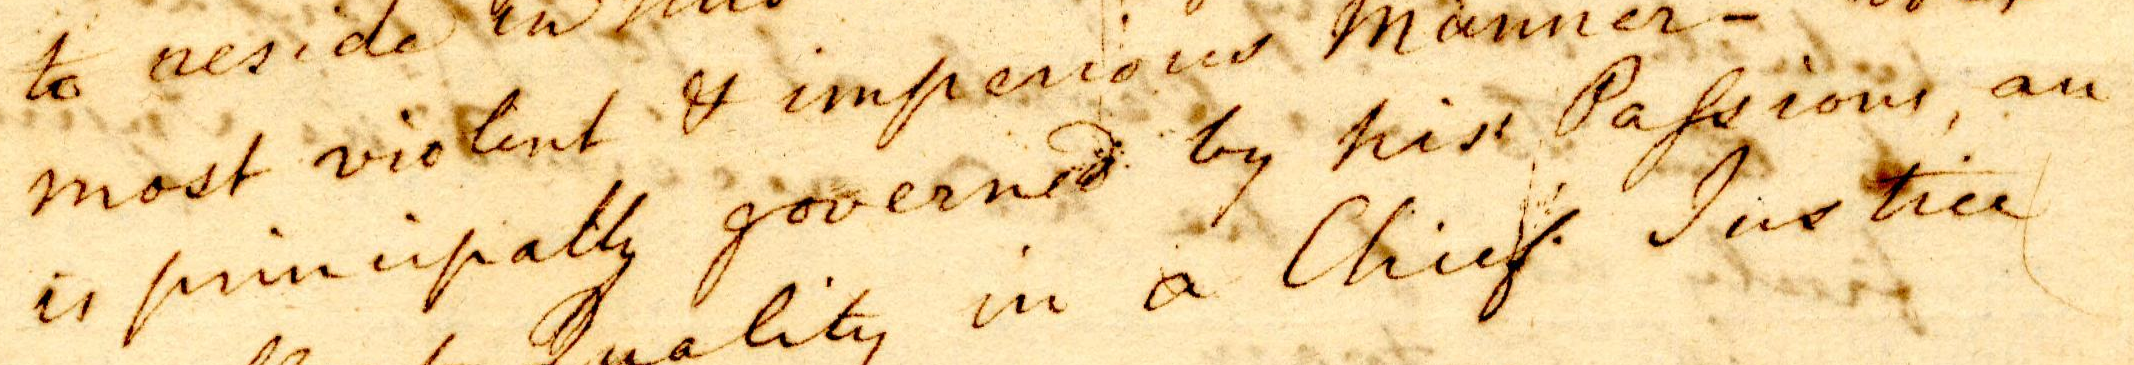is principally governed by his Passions, an
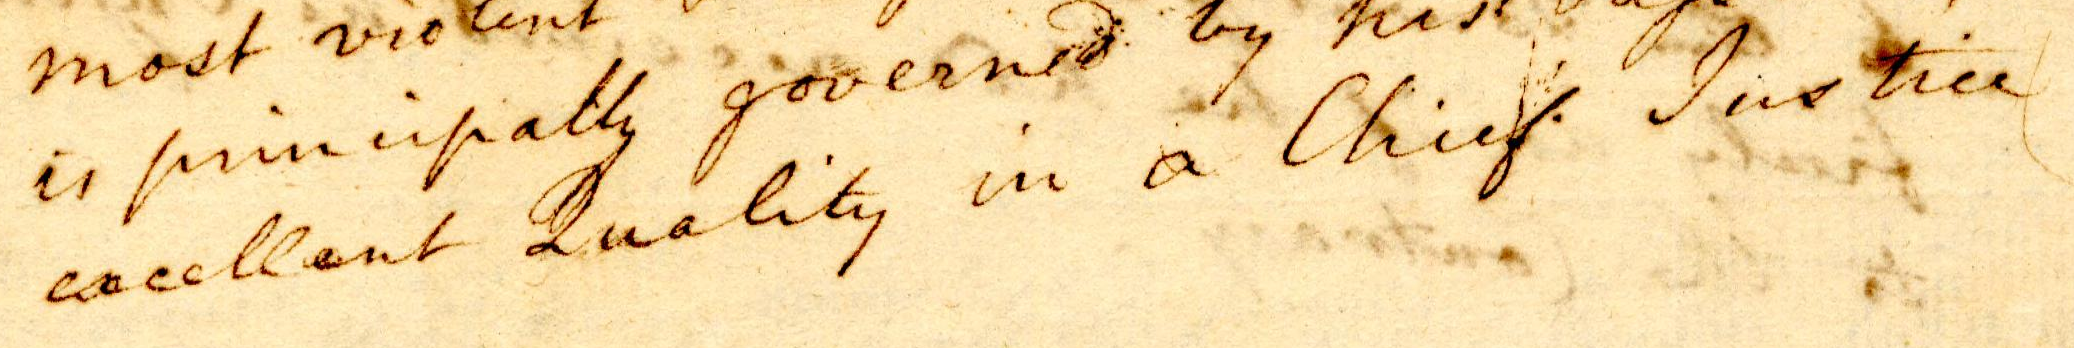excellent Quality in a Chief Justice
